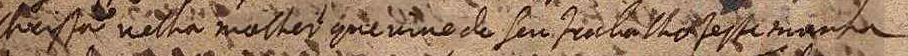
Christã velha molher que vive do seu trabalho testemunha
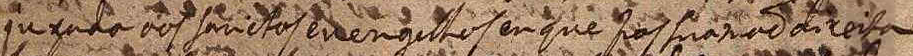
jurada aos Sanctos evangelhos en que pos sua maõ direita
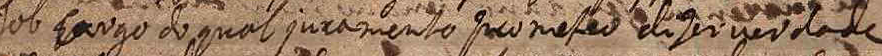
Sob cargo do qual juramento prometeo dizer verdade
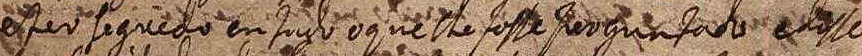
e ter segredo em tudo o que lhe fosse perguntado e disse
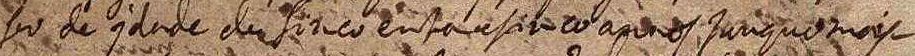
ser de idade de sincoenta e sinco annos pouquo mais
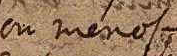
ou menos
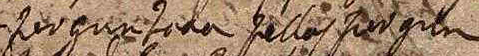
perguntada pella pergun
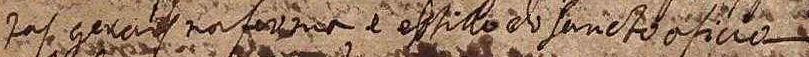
tas gerais na forma e estillo do Sancto ofiçio
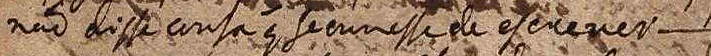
naõ disse cousa q̄ se ouuesse de escrever
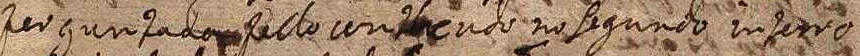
perguntada pello contheudo no segundo interro
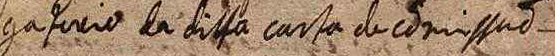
gatorio da ditta carta de comissaõ
